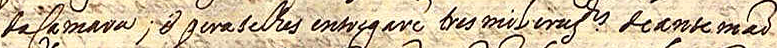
da Camara; e pera se lhes entregarē tres mil cruzdos de antemão
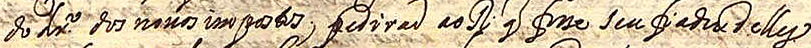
do dr.o dos nouos impostos; pedirão ao R. q̄ fosse seu fiador delles
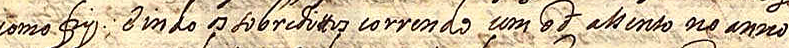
como foy; e indo os sobredittos correndo com o d̄ assento no anno
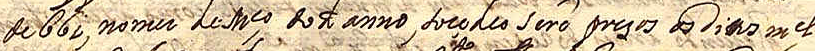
de 66i, no mez de Mço do d̄ anno, soçedeo serē presos os dittos mel
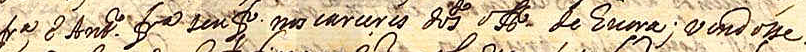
fra, e Ant.o fra seu fo nos carçeres do sto offo de Euora; vendosse
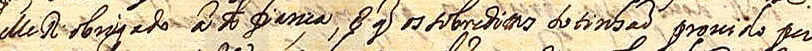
elle R. obrigado â d̄ fiança, e q̄ os sobredittos so tinhaõ prouido per
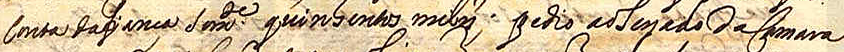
conta da fiança som.te quinhentos mil rs̄; pedio ao Senado da Camara
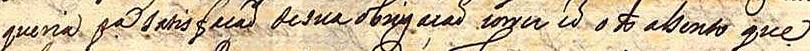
queria pa satisfaçaõ de sua obrigação correr cō o d̄ assento que
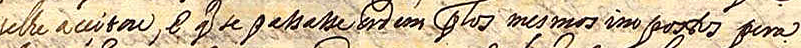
se lhe açeitou, e q̄ se passasse ordem p̄los mesmos impostos pera
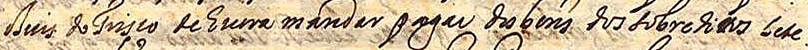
o Iuis do Fisco de Euora mandar pagar dos bens̄ dos sobredittos sete
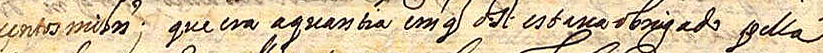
çentos mil rs̄; que era a quantia em q̄ o R. estaua obrigado pella
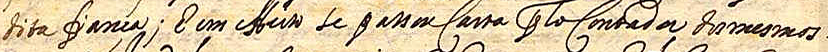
dita fiança; e em effeito se passou Carta p̄lo Contador dos mesmos
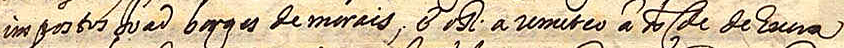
impostos Ioaõ borges de morais, e o R. a remeteo â d̄ Cde de Euora
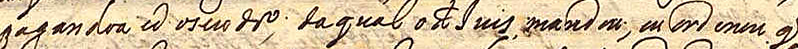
pagandoa cō o seu dro; da qual o d̄ Iuis mandou, ou ordenou q̄
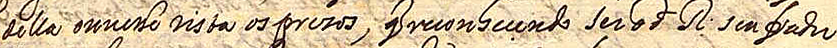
della ouuessē uista os prezos, q̄ reconhecendo ser o d̄ R. seu fiador
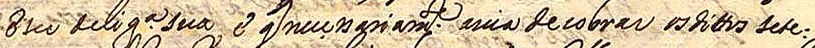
e ser delig.a sua e q̄ necessariamte. auia de cobrar os dittos sete
